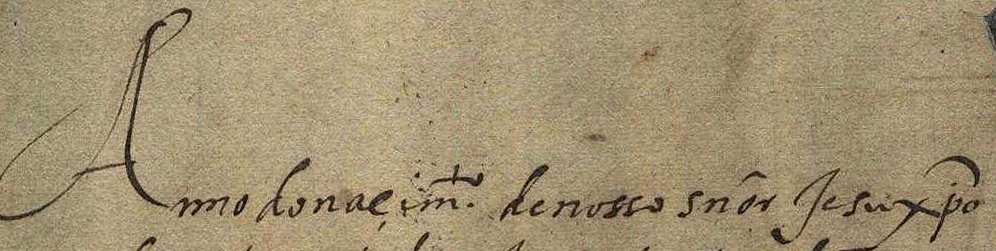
Anno do nacim.to de nosso snōr Jesu xp̄o
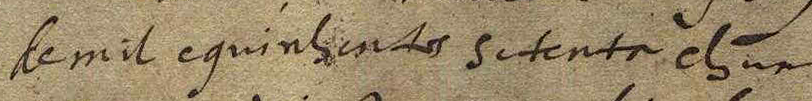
de mil e quinhentos setenta e hum
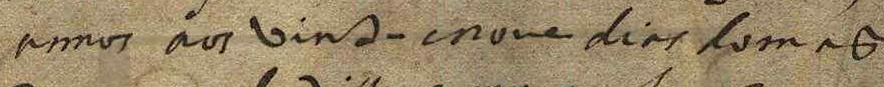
annos aos vinte e noue dias do mes
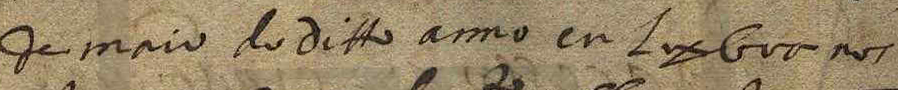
de maio do ditto anno en Lixboa nos
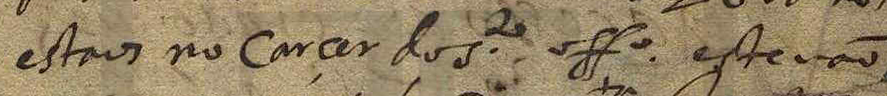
estaos no Carcer do s.to offo. esteuaõ
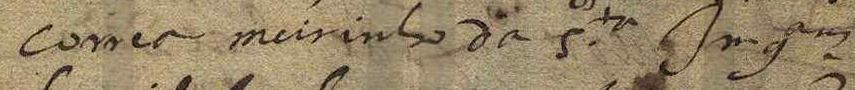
correa meirinho da s.ta Jmqam
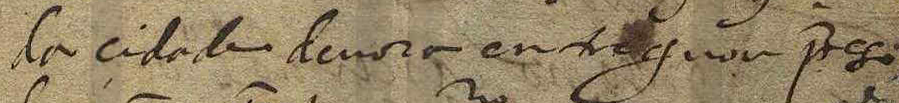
da cidade deuora entreguou preso
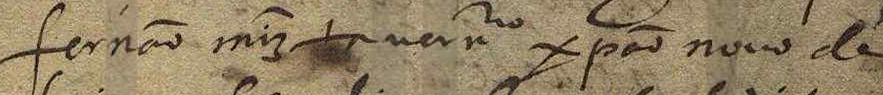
fernão mīz tauernro xpão nouo de
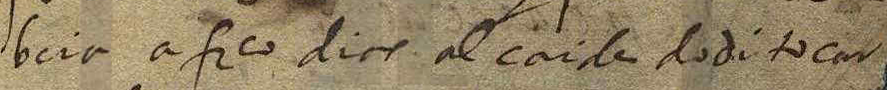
beia a frco dias alcaide do dito car
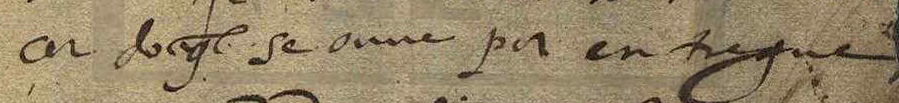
cer do q̄l se ouue por entregue
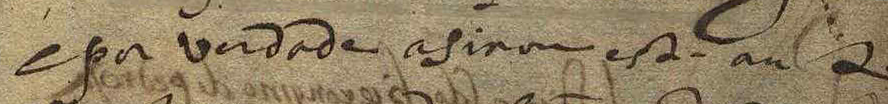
e por verdade asinou este auto
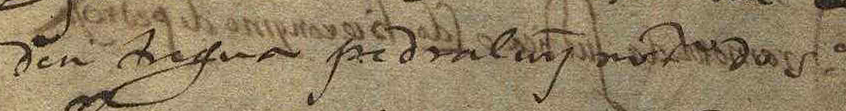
dentregua pedraluēz notro do s.to
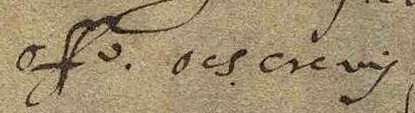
offo. o escreuy
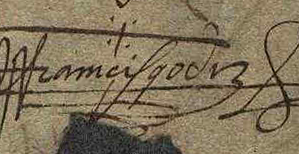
framcisqo diz
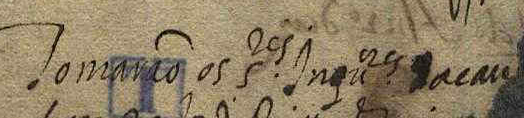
Tomarão os s.res Inqu.ores da cau
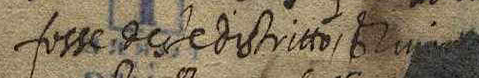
fosse deste distritto/ p̄o u
